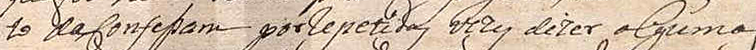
to da Confessam por Repetidas vezes dizer algumas
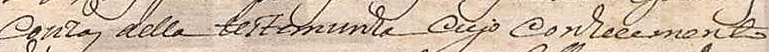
Couzas della testemunha cujo conhecimento
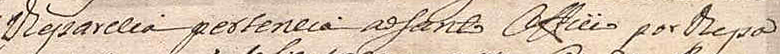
lhe parecia pertencia ao santo Officio por lhe pa
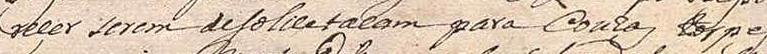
reçer serem de solicitacam para Couzas torpes
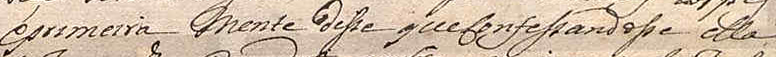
e primeiramente disse que Confessandosse ella
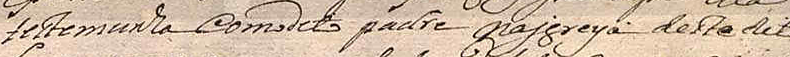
testemunha com o dito padre na jgreya deste dito
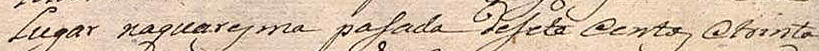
lugar na quaresma pasada de seteCentos e trinta
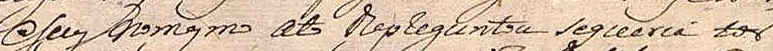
e seis no mesmo ato lhe pReguntou se queria tor
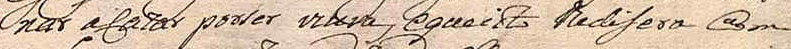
nar a Cazar por ser viuva, e que isto lhe disera com
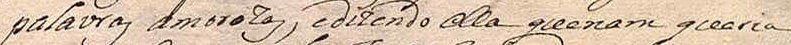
palavras amoroZas, e dizendo ella que nam queria
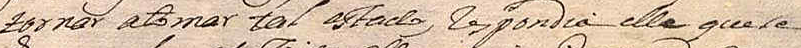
tornar a tomar tal estado, respondia elle que se
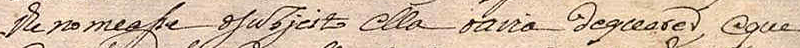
lhe nomease o subjeito ella o avia de querer, e que
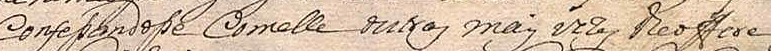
confessandosse com elle outras mais vezes lhe offere
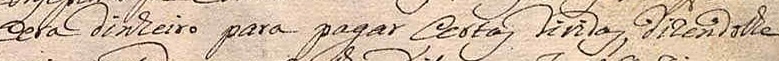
cera dinheiro para pagar Çertas dividas, dizendolhe
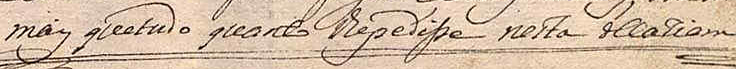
mais que tudo quanto lhe pedisse nesta occaziam
